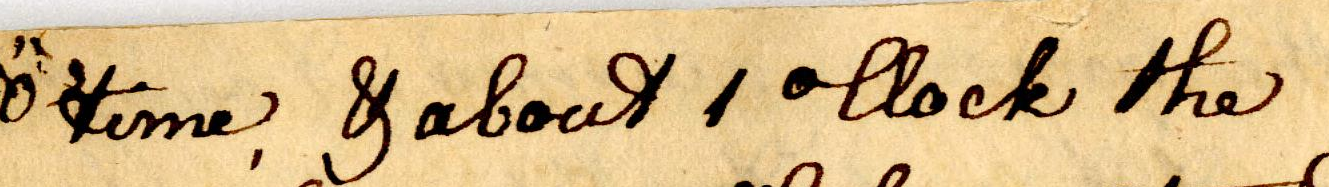time, & about 1 ^o Clock the
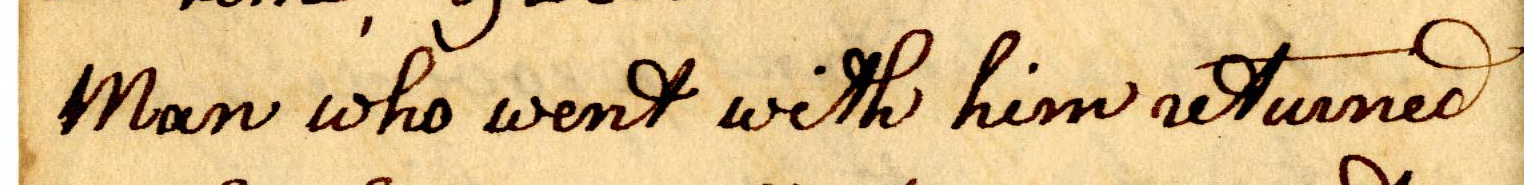Man who went with him returned
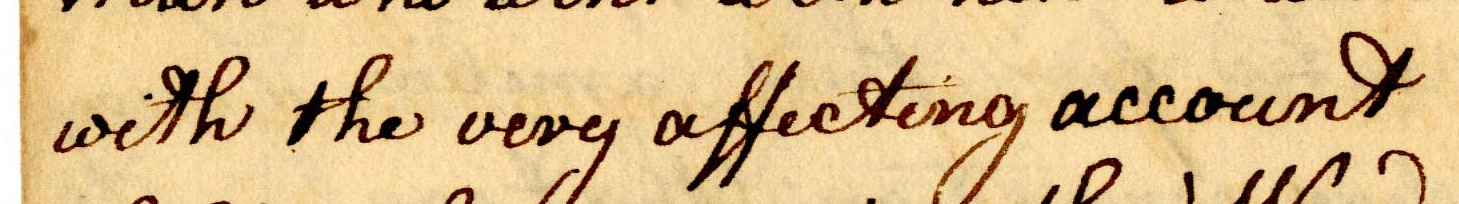with the very affecting account
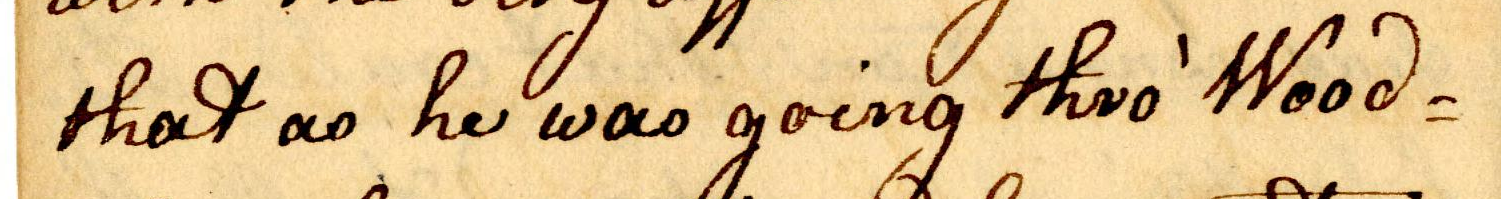that as he was going thro' Wood-
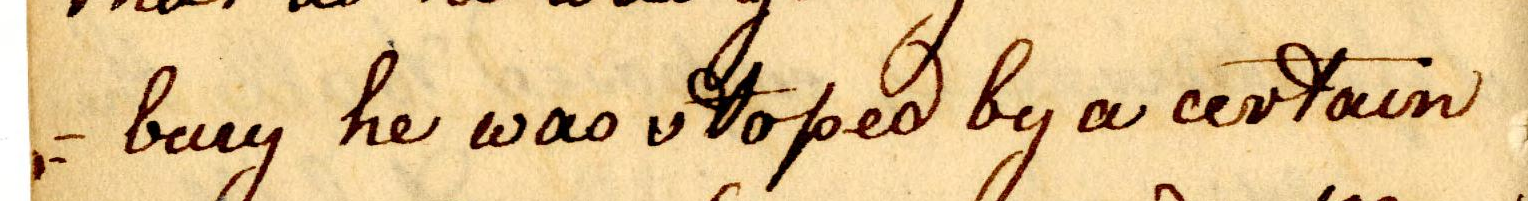-bury he was stoped by a certain
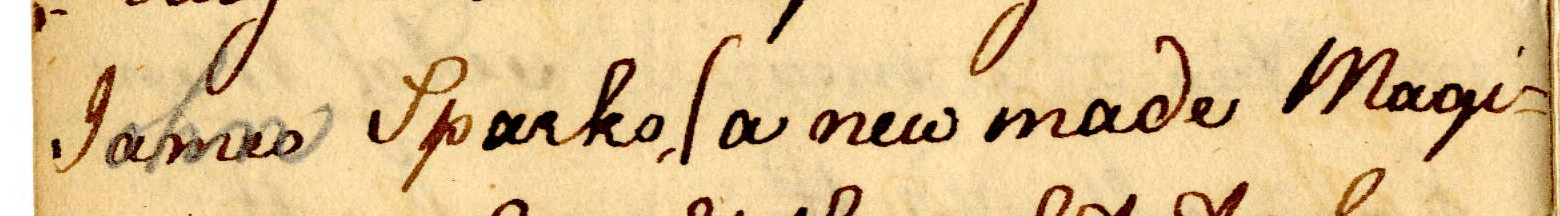James Sparks (a new made Magi-
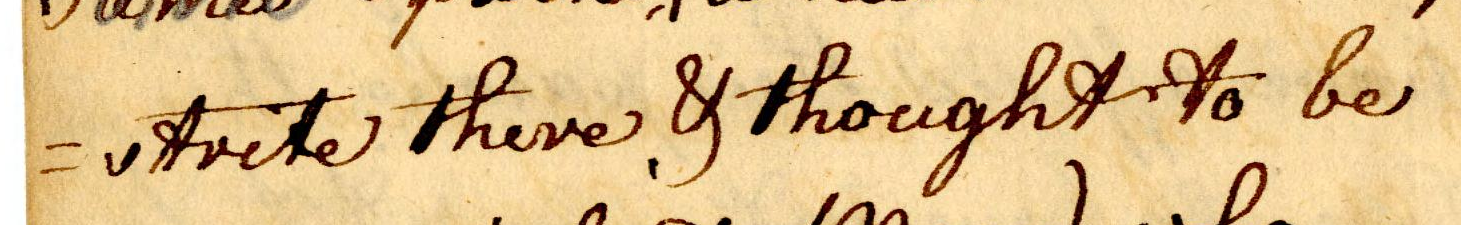-strite there, & thought to be
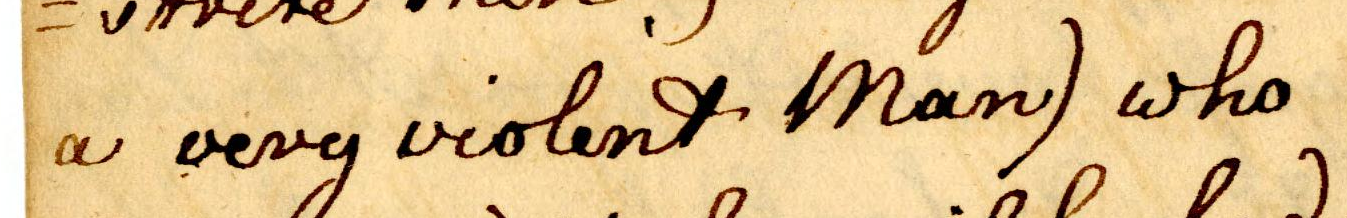a very violent Man) who
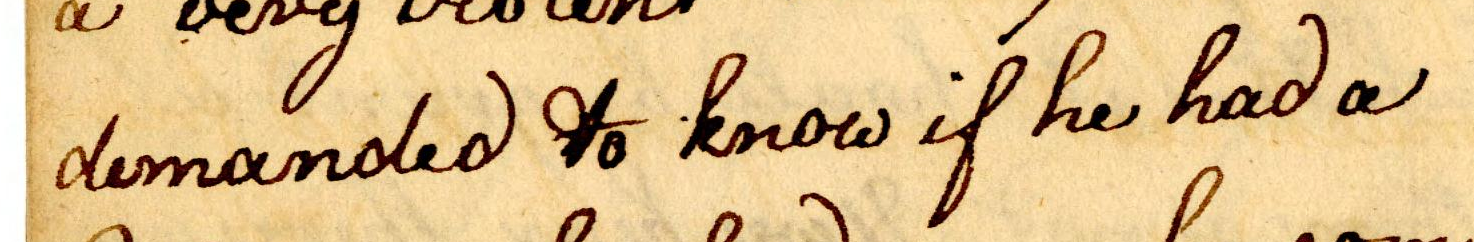demanded to know if he had a
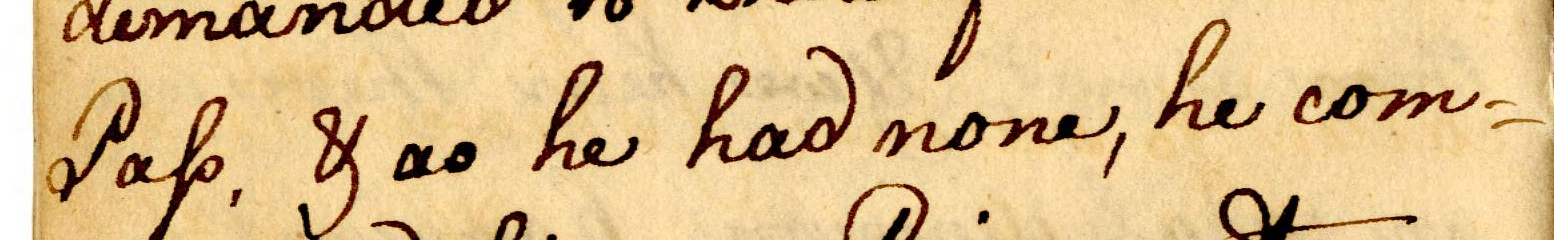Pass, & as he had none, he com-
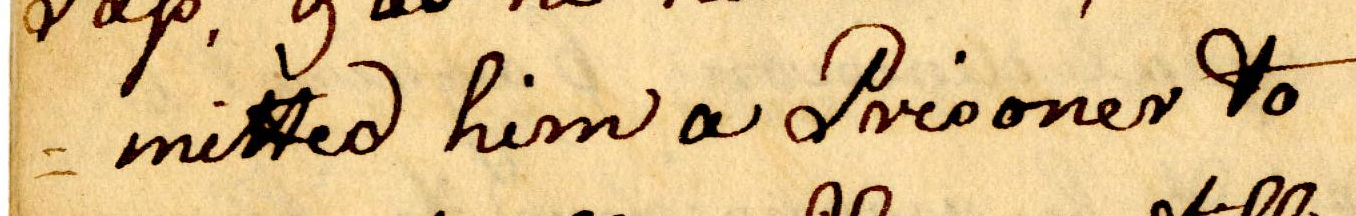-mitted him a Prisoner to
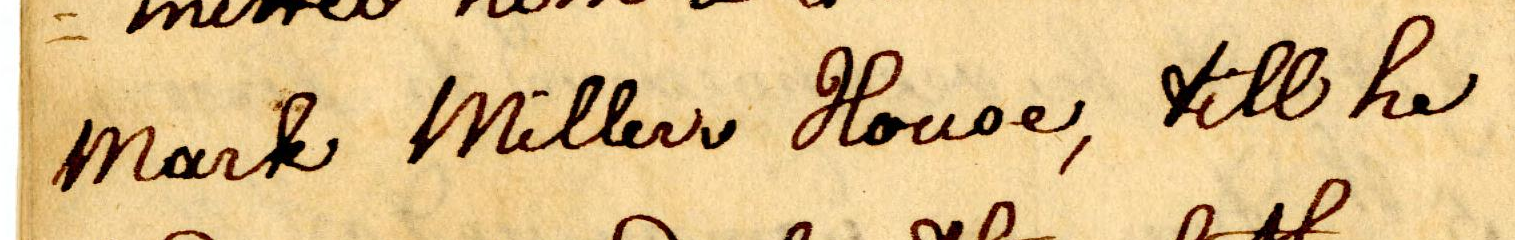Mark Millers House, till he
